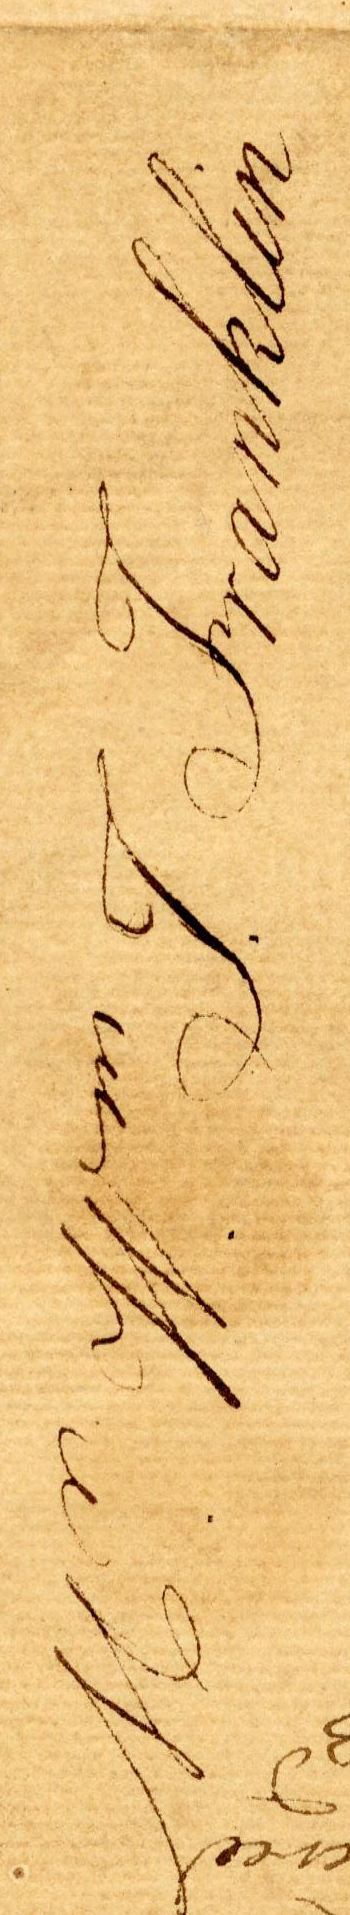M^r. W^m. T. Franklin
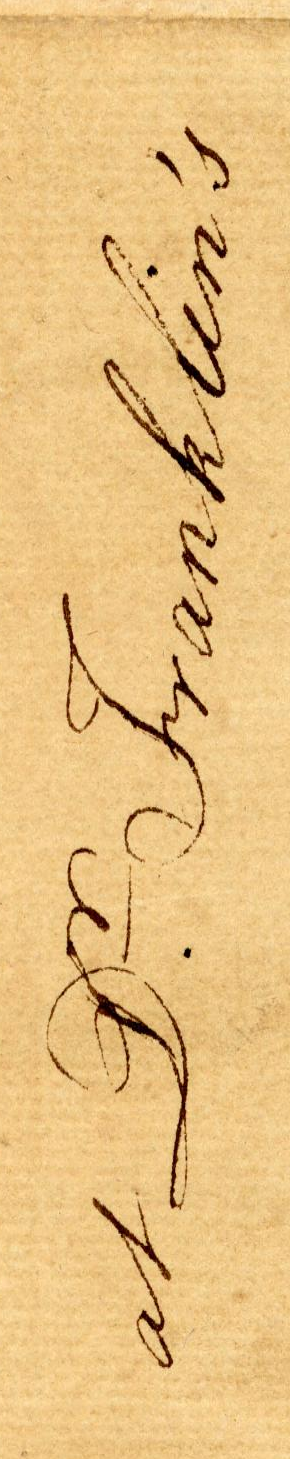at D^r. Franklin's
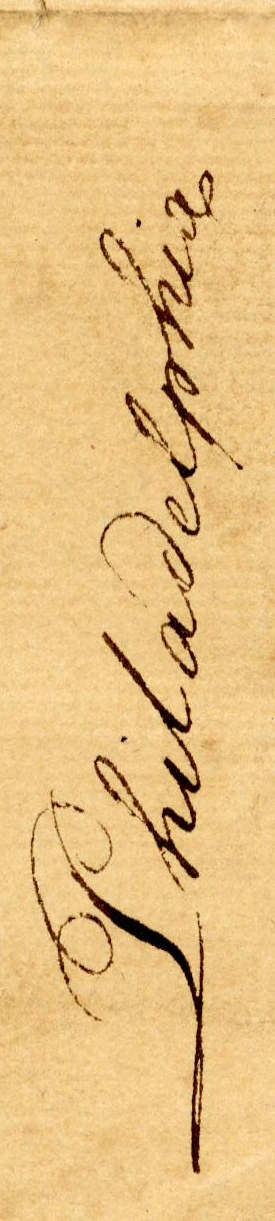Philadelphia
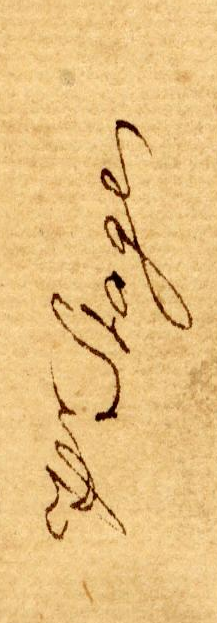per Stage
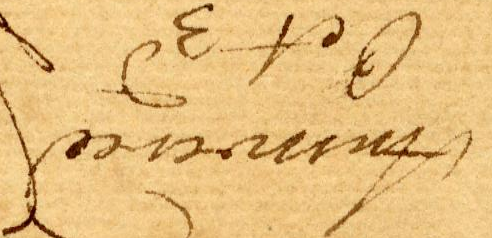Answered
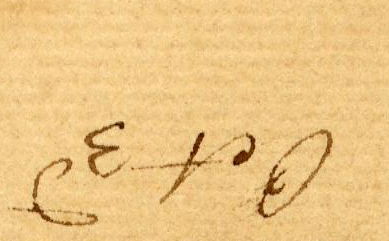Oct 3^d
